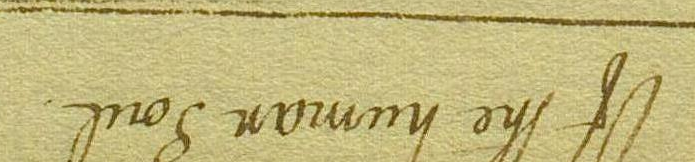Of the human Soul.
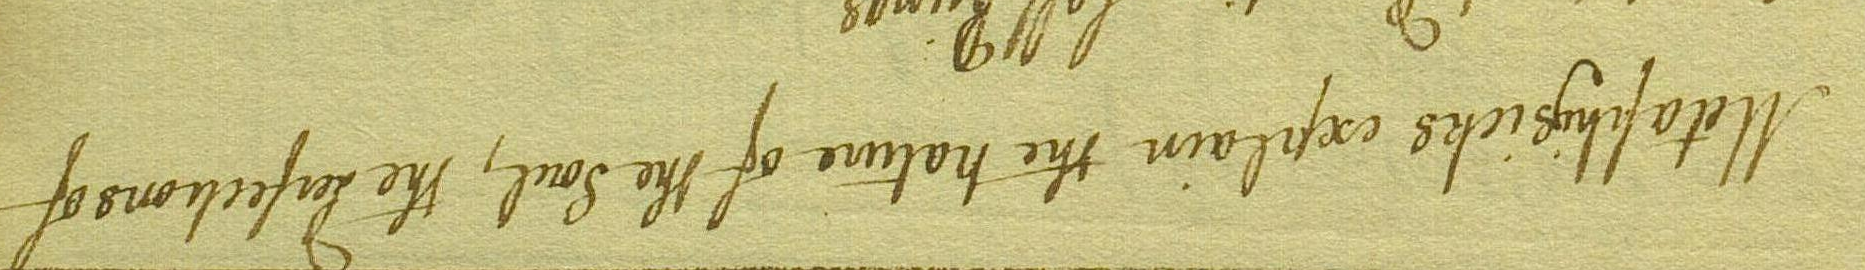Metaphysicks explain the nature of the Soul, the Perfections of
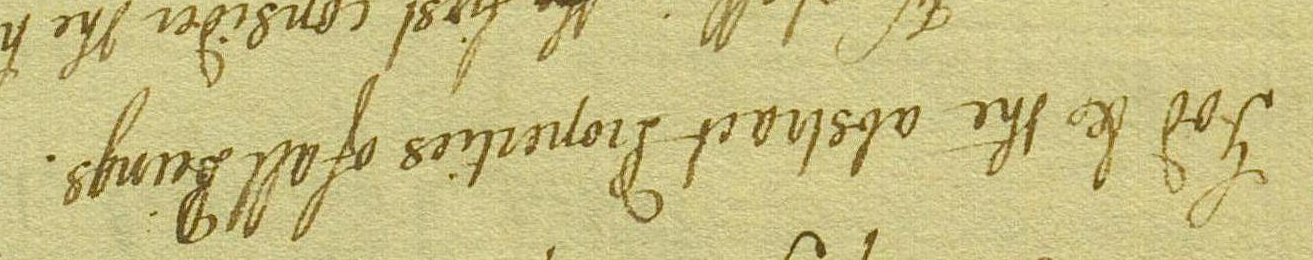God & the abstract Properties of all Beings.
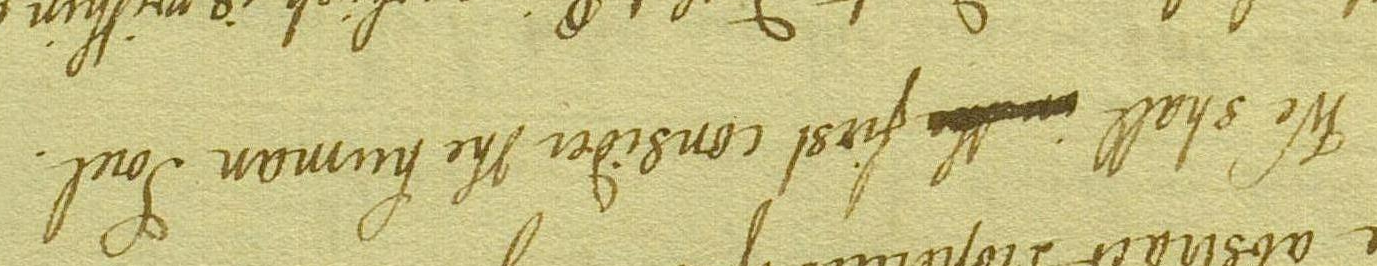We shall in the first consider the human Soul.
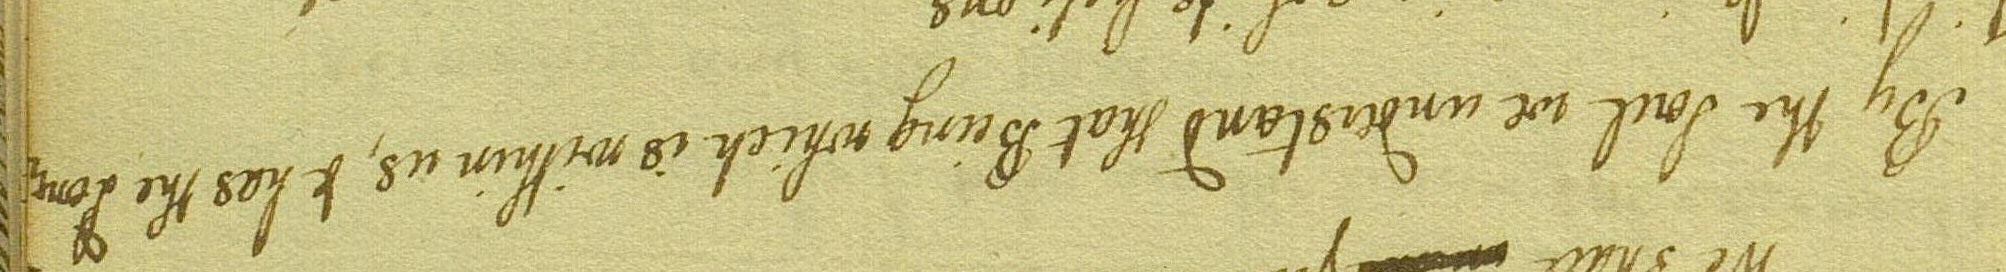By the Soul we understand that Being which is within us, & has the Power
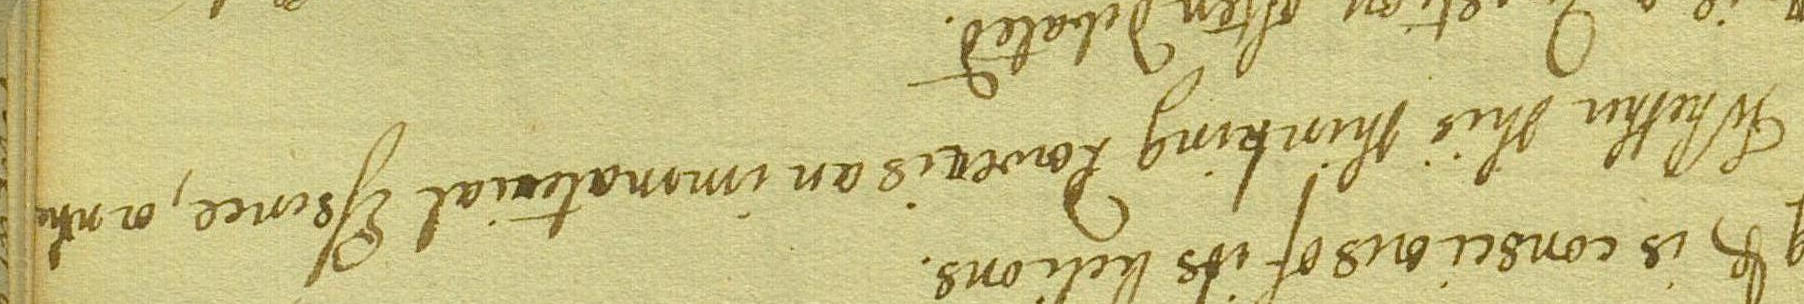Whether this thinking Power is an immaterial Essence, or whe
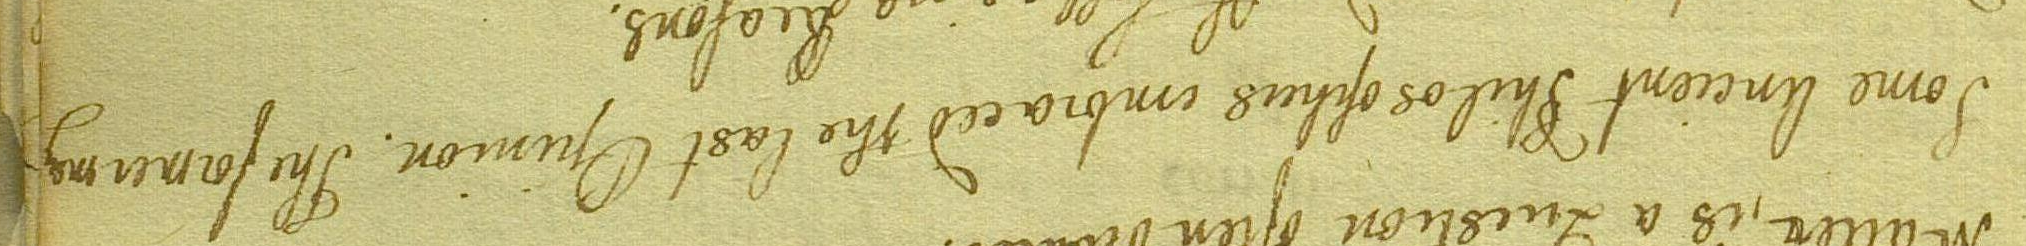Some Ancient Philosophers embraced the last Opinion. The former may
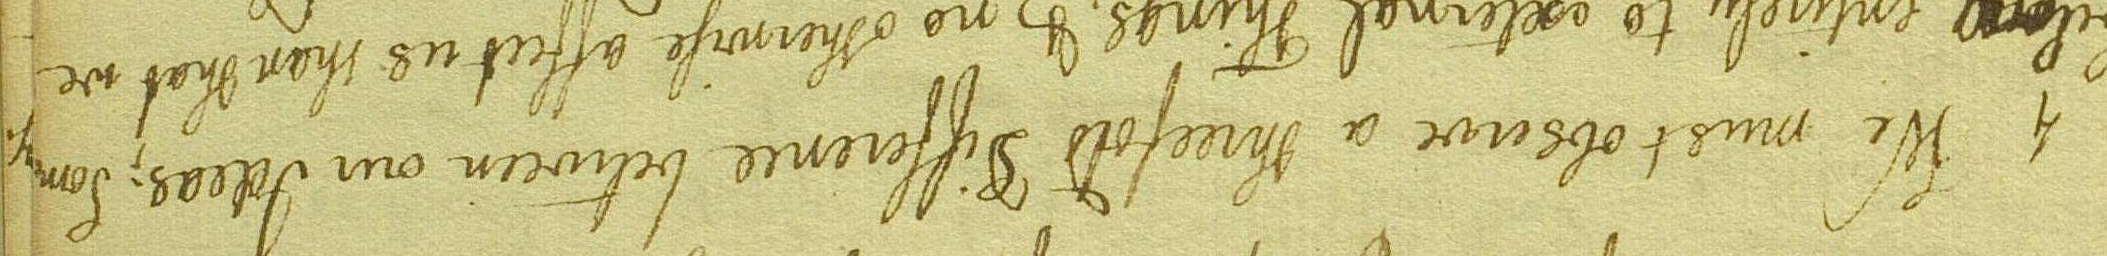4 We must observe a threefold Difference between our Ideas; Som-
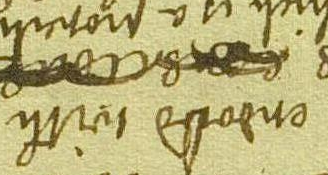endowd with
